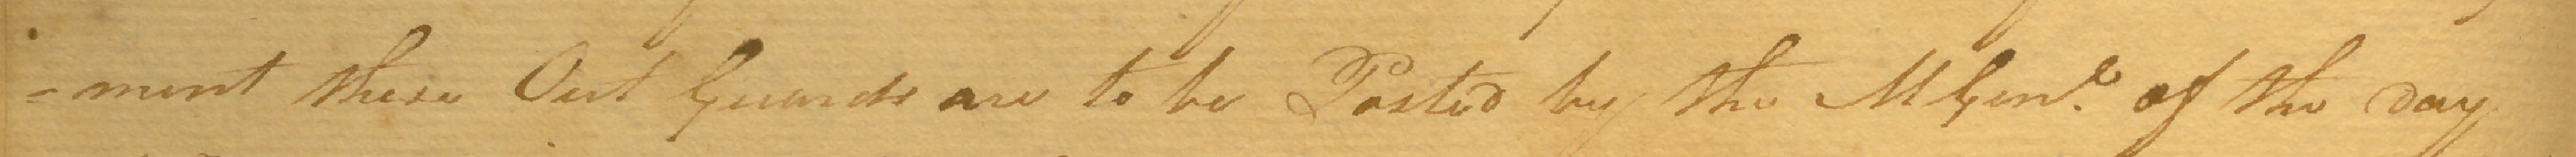-ment these Out Guards are to be Posted by the M Gen^l. of the day
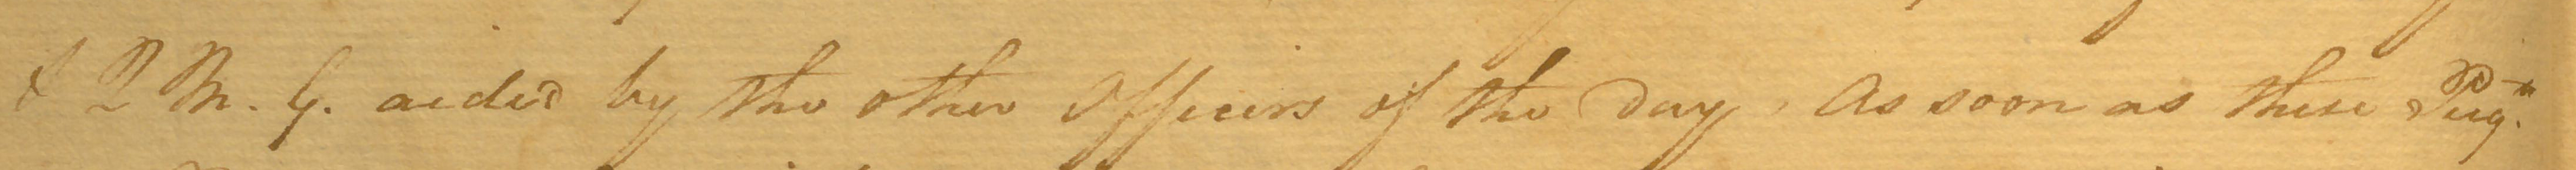& Q M. G. aided by the other Officers of the day, As soon as these Picq^ts.
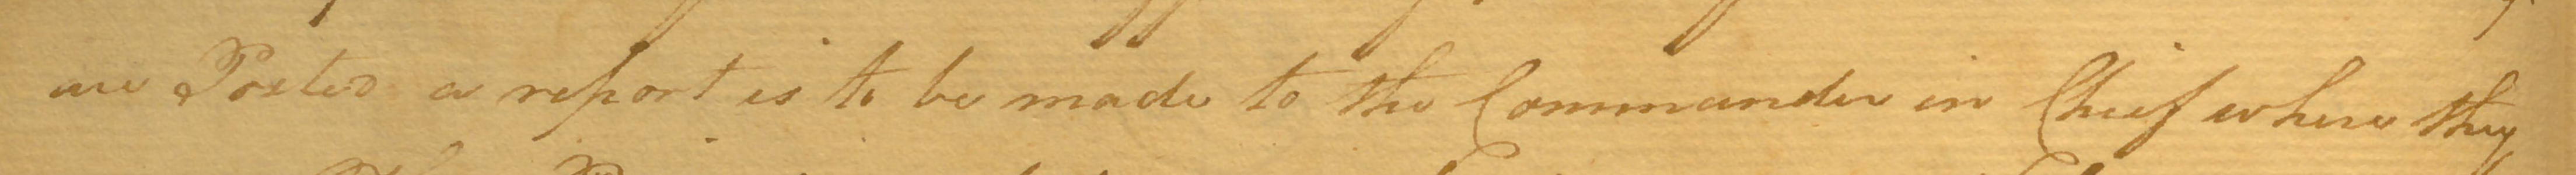are Posted a report is to be made to the Commander in Chief where they
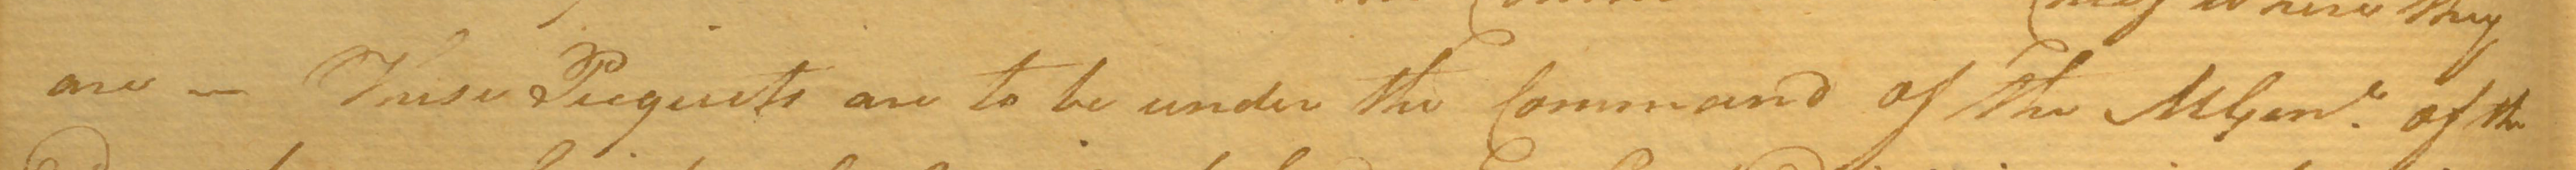are- These Picquets are to be under the Command of the M Gen^l. of the
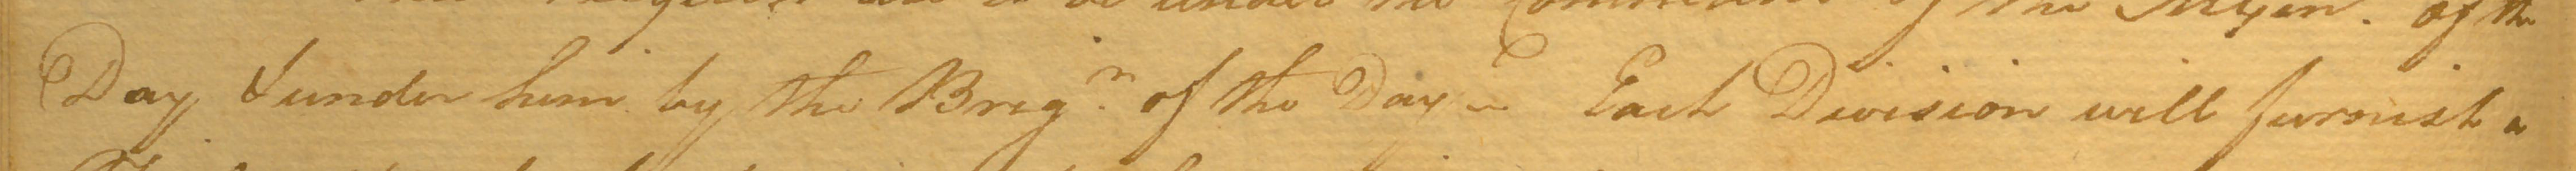Day & under him by the Brig^r. of the Day- Each Division will furnish a
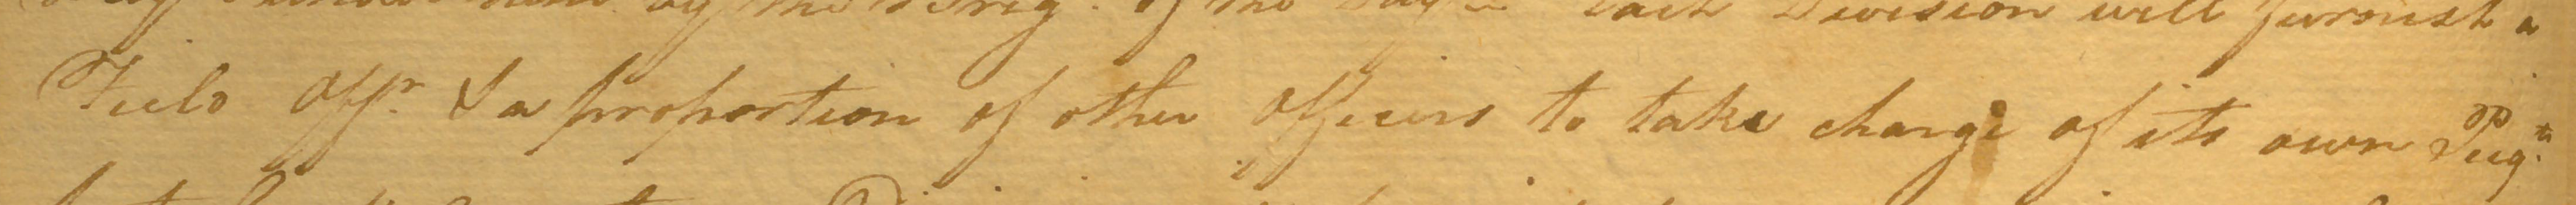Field Off^r. & a proportion of other Officers to take charge of its own Picq^t.
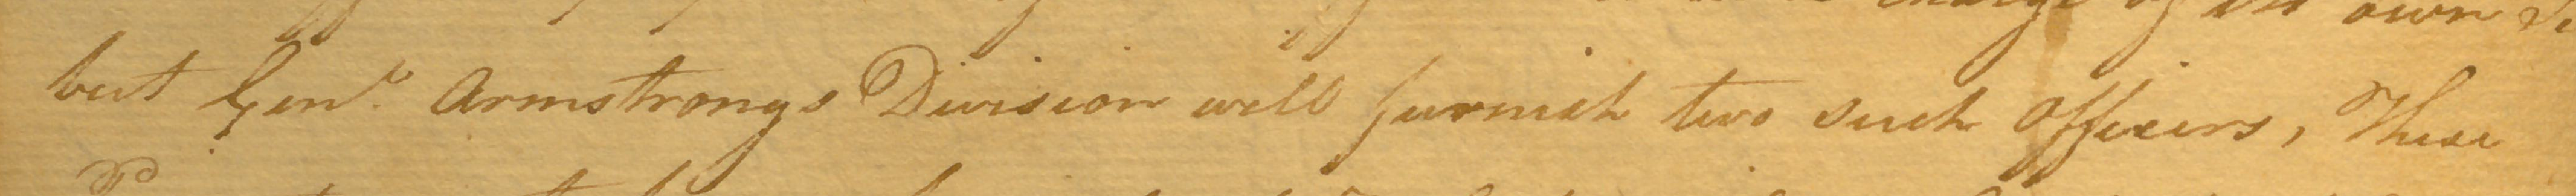but Gen^l. Armstrongs Division will furnish two such Officers, These
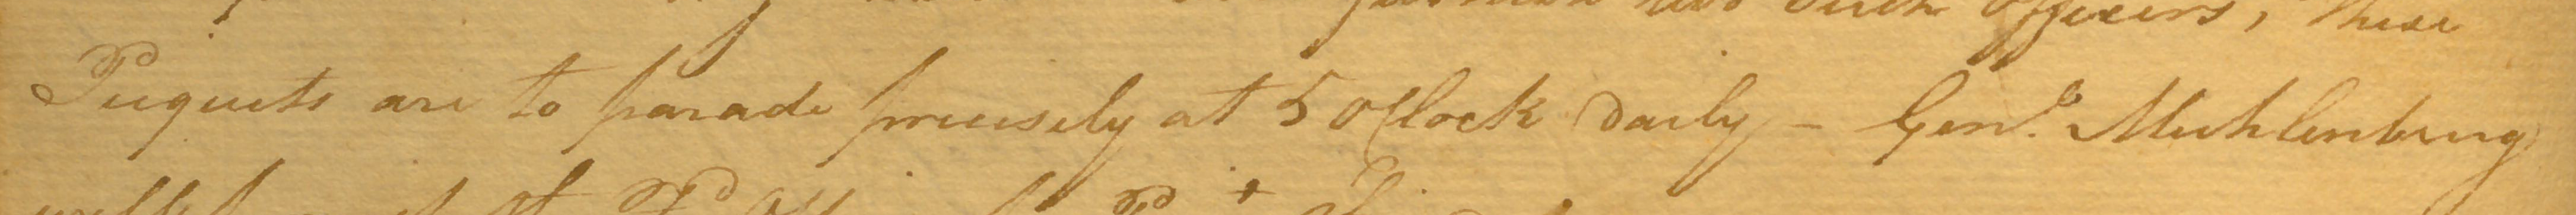Picquets are to parade precisely at 5 oClock daily- Gen^l. Muhlenburg
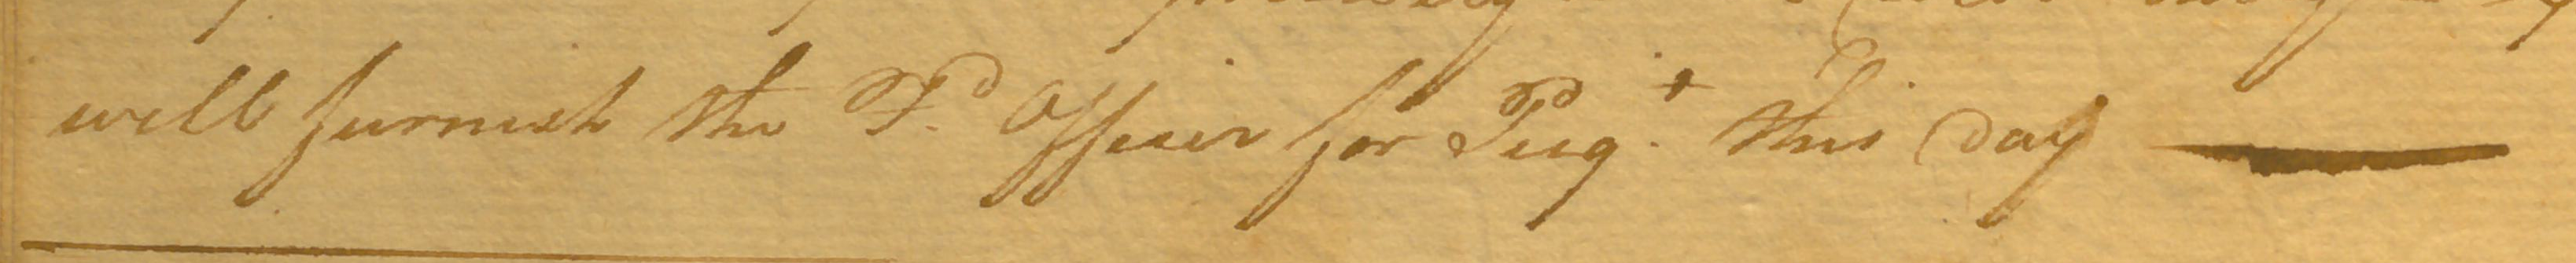will furnish the F^d. Officer for Picq^t. this day-
